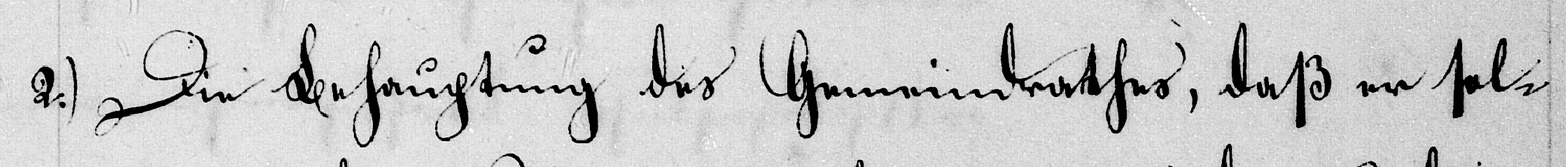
2.) Die Behauptung des Gemeindrathes, daß er sol¬
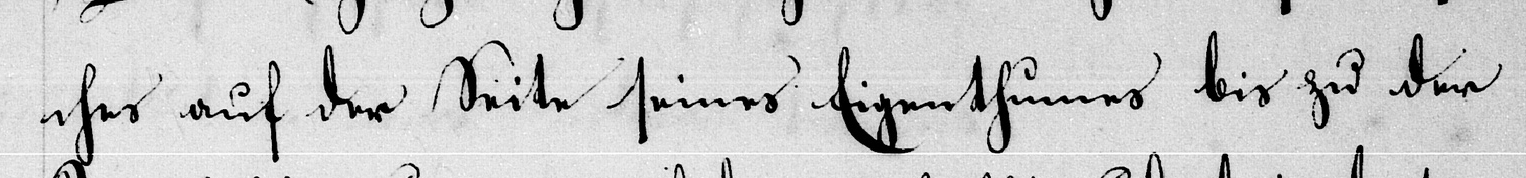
ches auf der Seite seines Eigenthumes bis zu der
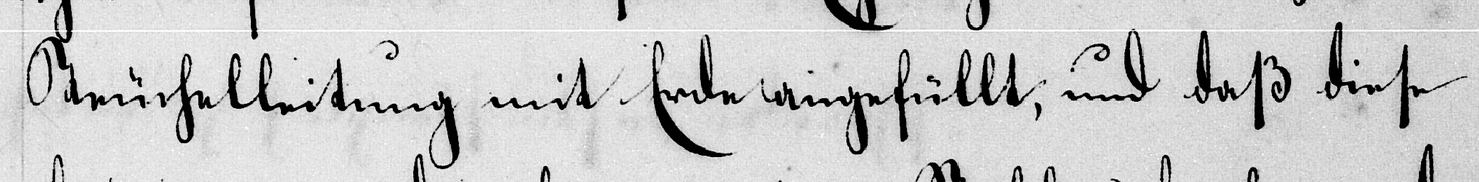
Teuchelleitung mit Erde angefüllt, und daß diese
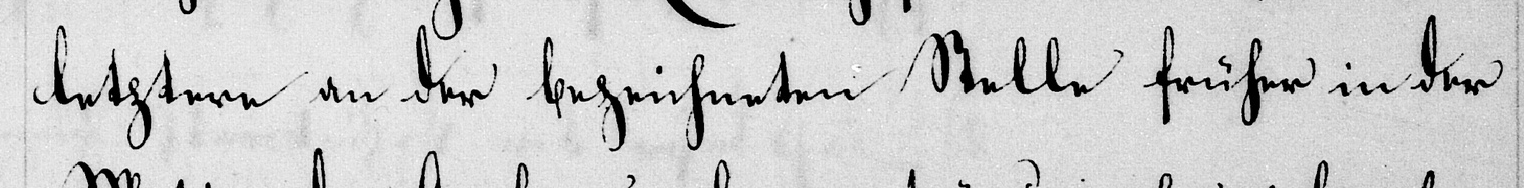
letztere an der bezeichneten Stelle früher in der
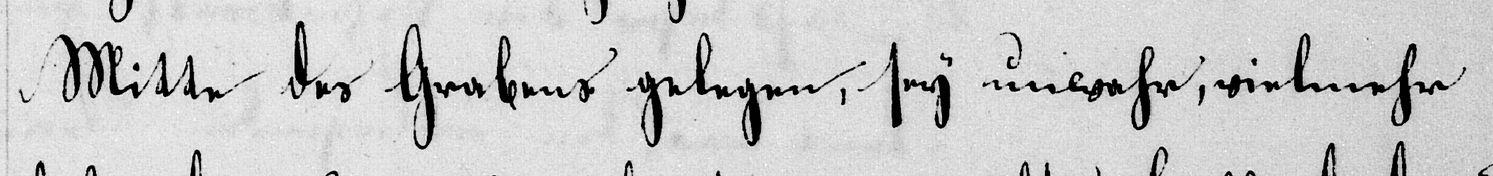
Mitte des Grabens gelegen, sey unwahr, vielmehr
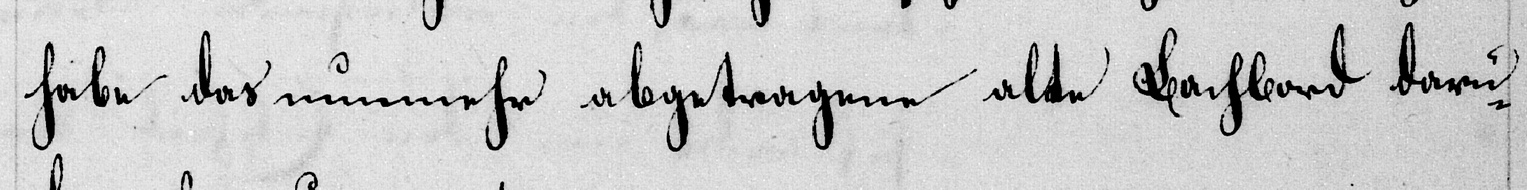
habe das nunmehr abgetragene alte Bachbord darü¬
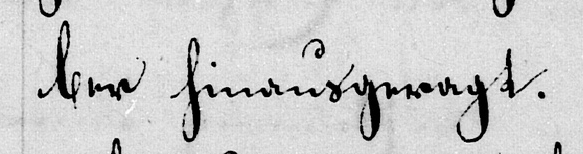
ber hinausgeragt.
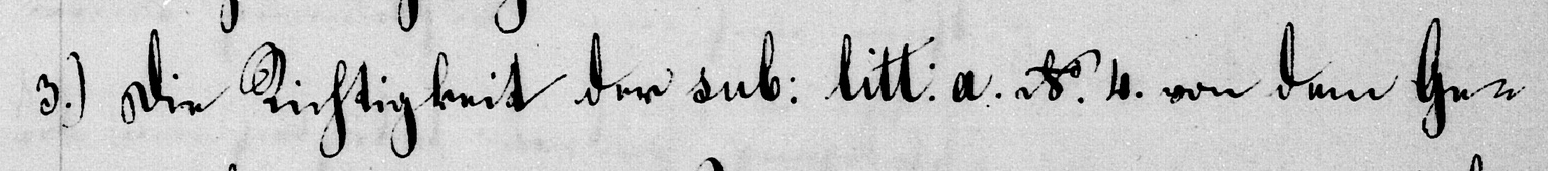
3.) Die Richtigkeit der sub: litt: a. N°.4. von dem Ge¬
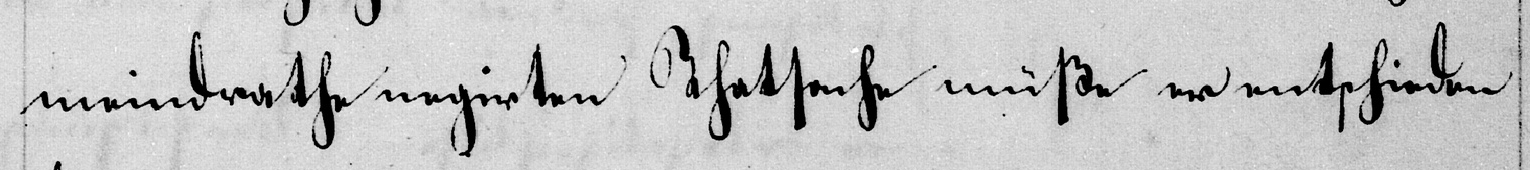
meindrathe negirten Thatsache müße er entschieden
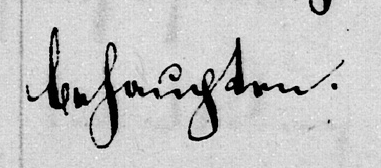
behaupten.
